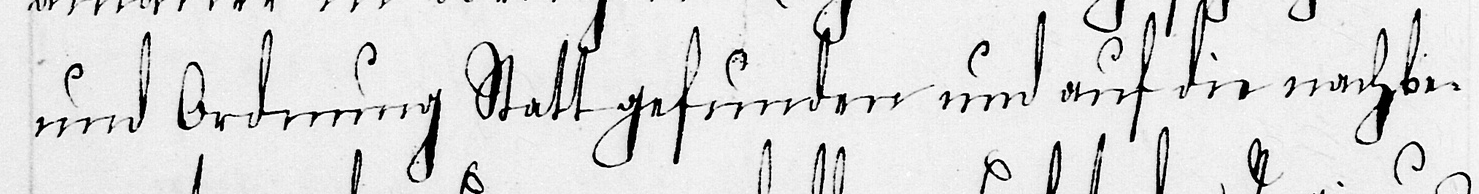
und Ordnung Statt gefunden und auf die nachbe¬
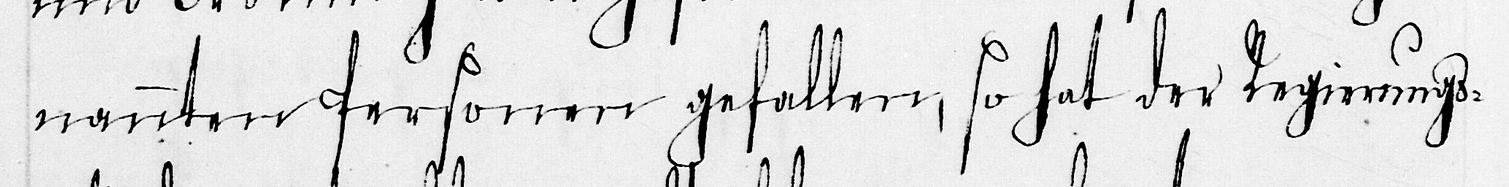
nannten Personen gefallen, so hat der Regierungs¬
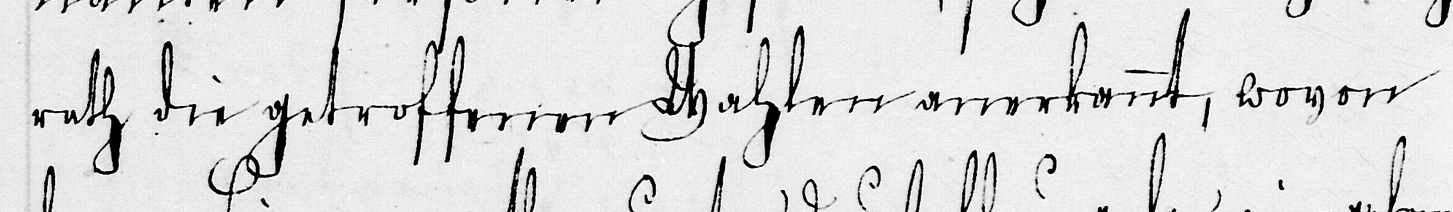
rath die getroffenen Wahlen anerkannt, wovon
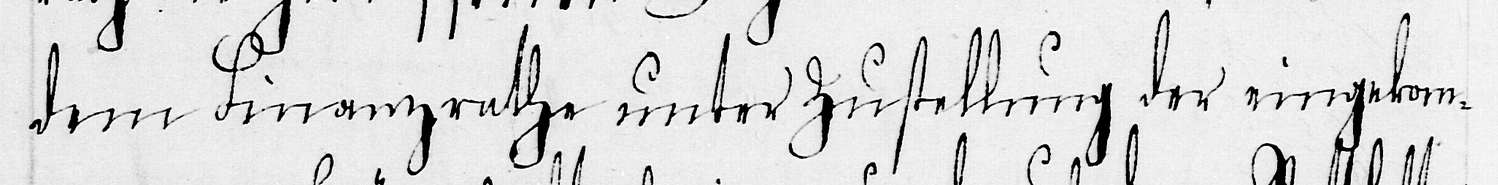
dem Finanzrathe unter Zustellung der eingekom¬
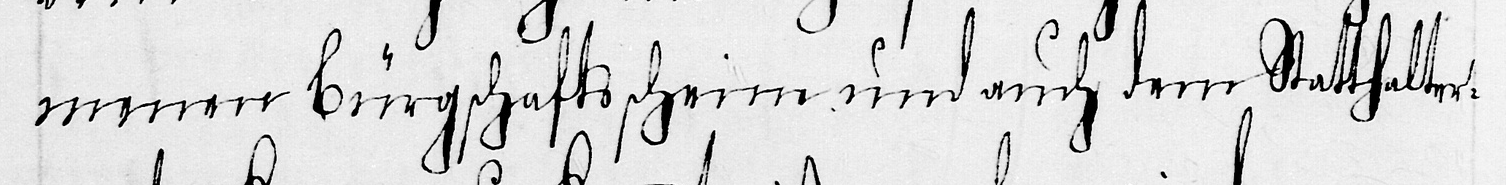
menen Bürgschaftsscheine und auch dem Statthalter¬
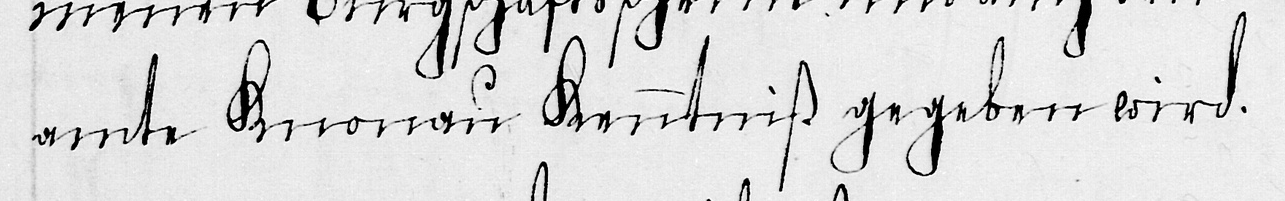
amte Knonau Kenntniß gegeben wird.
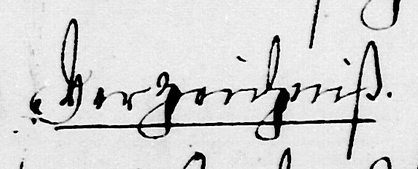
Verzeichniß.
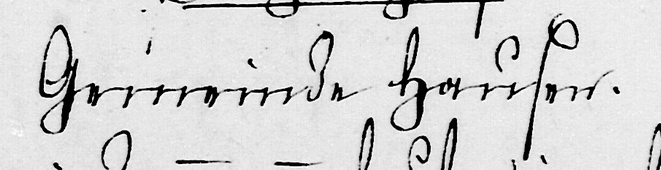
Gemeinde Hausen.
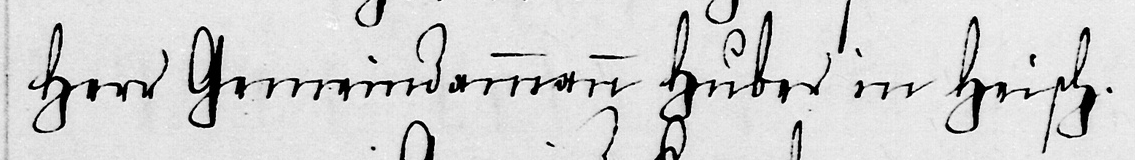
Herr Gemeindammann Huber in Heisch.
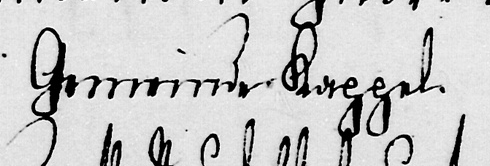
Gemeinde Kappel.
